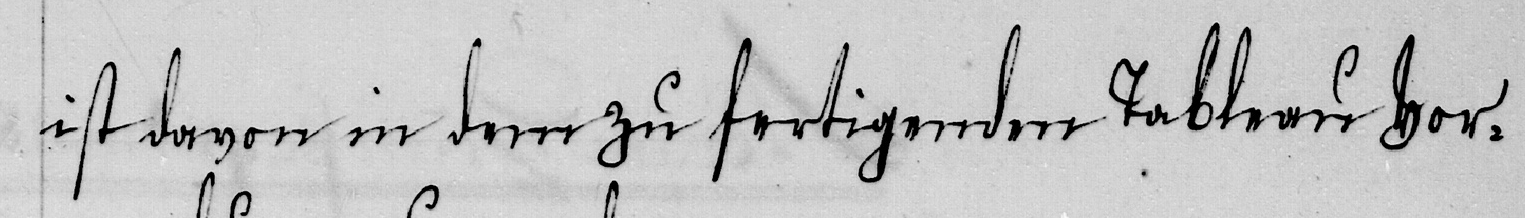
ist davon in dem zu fertigenden Tableau Vor¬
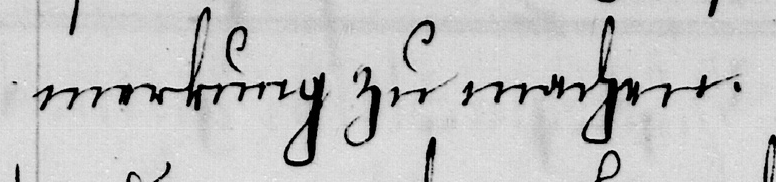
merkung zu machen.
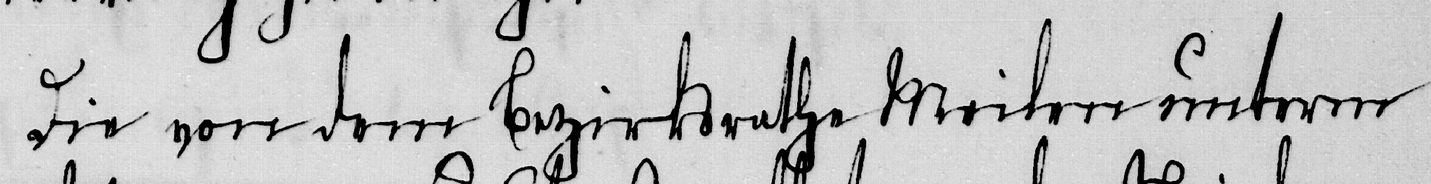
Die von dem Bezirksrathe Meilen unterm
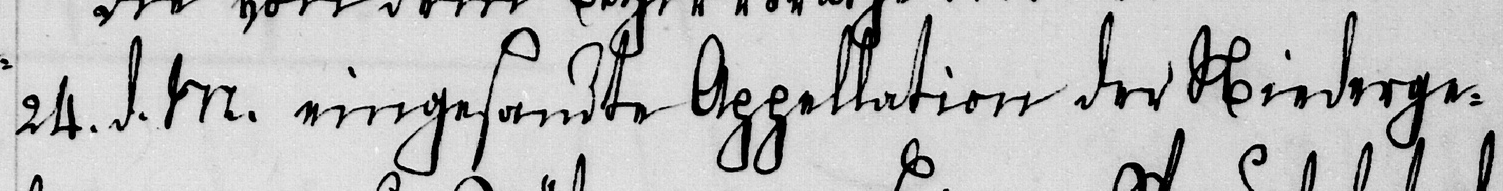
24. d. M. eingesandte Appellation der Niederge¬
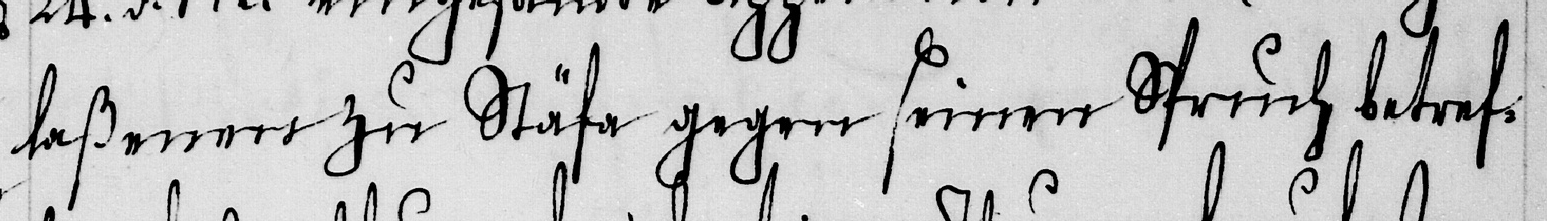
laßenen zu Stäfa gegen seinen Spruch betref¬
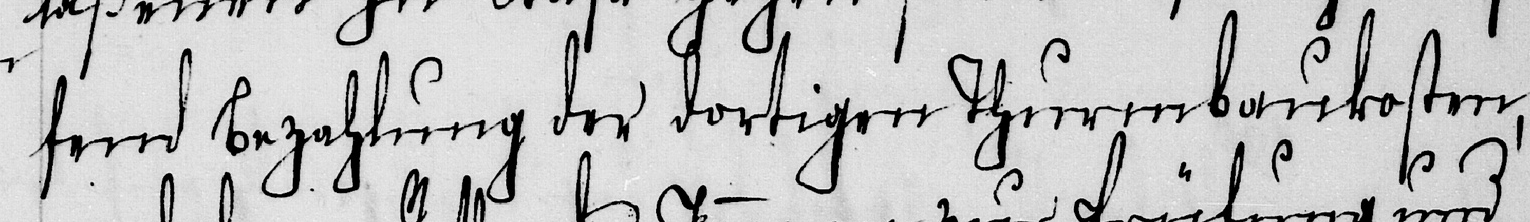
fend Bezahlung der dortigen Thurmbaukosten,
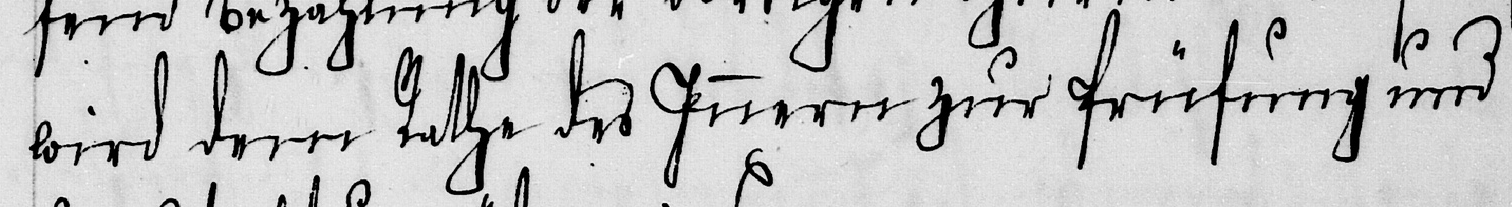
wird dem Rathe des Innern zur Prüfung und
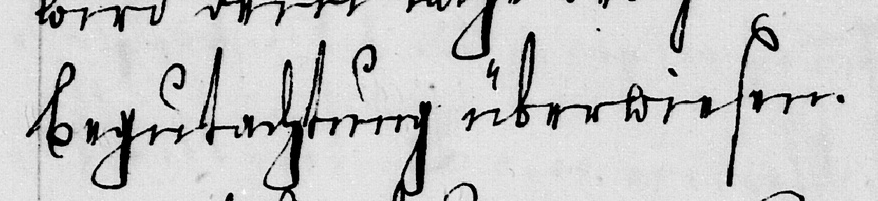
Begutachtung überwiesen.
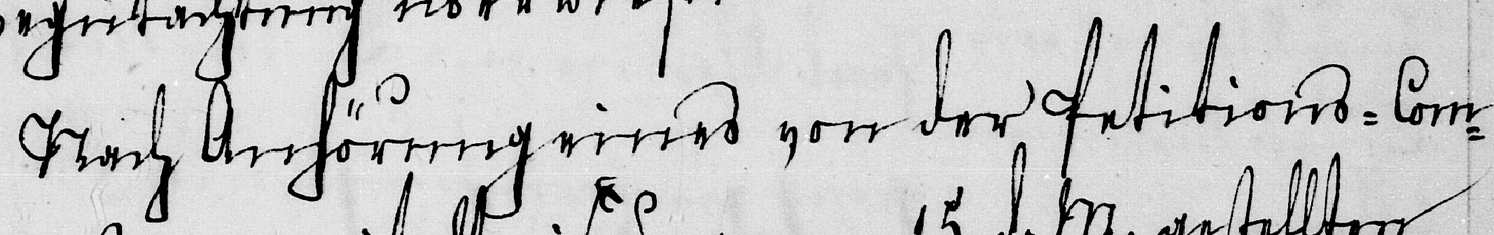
Nach Anhörung eines von der Petitions-Com¬
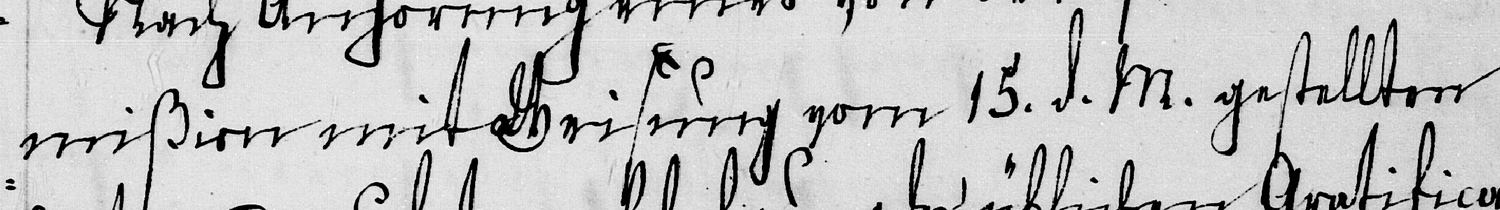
mißion mit Weisung vom 15. d. M. gestellten
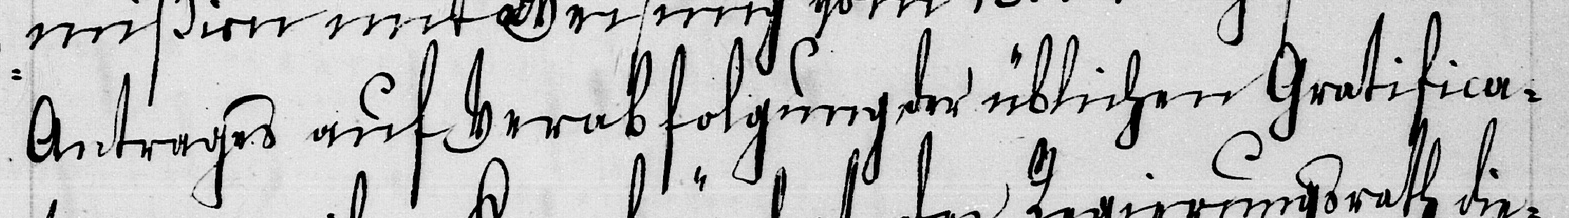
Antrages auf Verabfolgung der üblichen Gratifica¬
